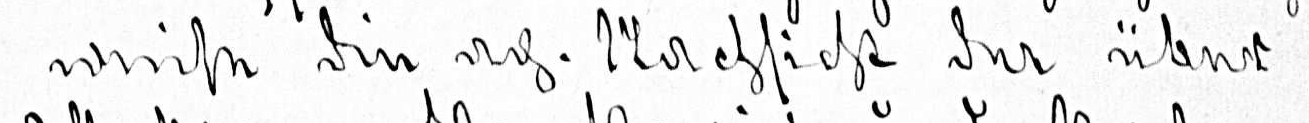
weise die ag. Nachsicht der über
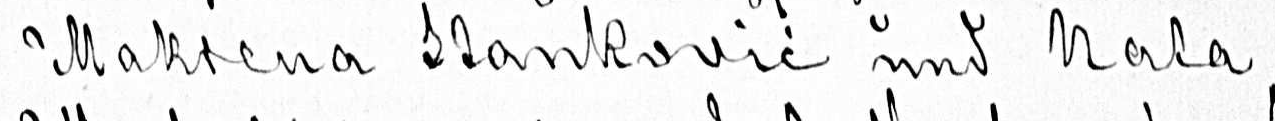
Makrena Skanković und Nala
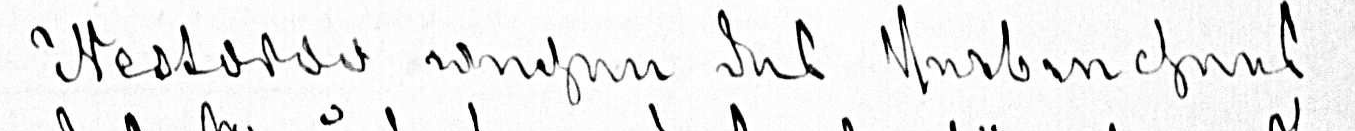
Nestorov wegen des Verbrechens
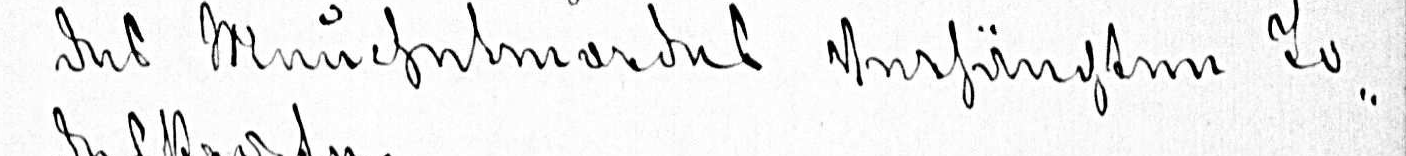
des Meuchelmordes verhängten To¬
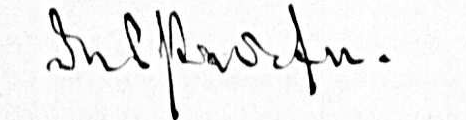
desstrafe.
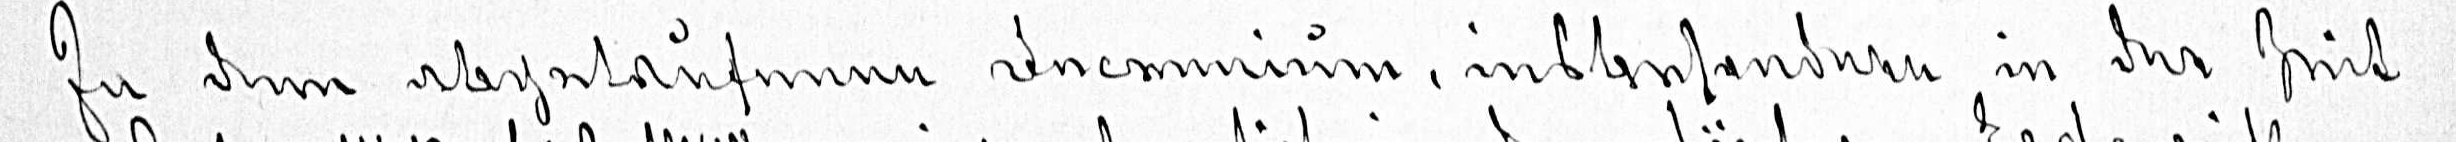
In dem abgelaufenen Decennium, insbesondere in der Zeit
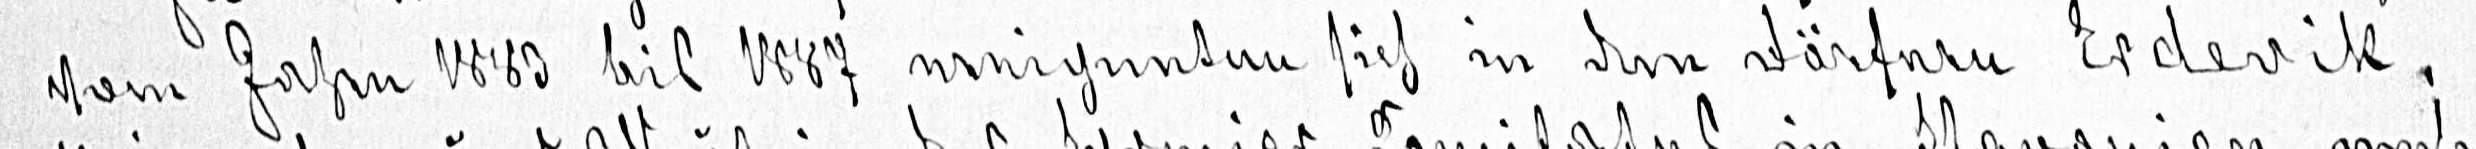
vom Jahre 1883 bis 1887 ereigneten sich den Dörfern Erdevik,
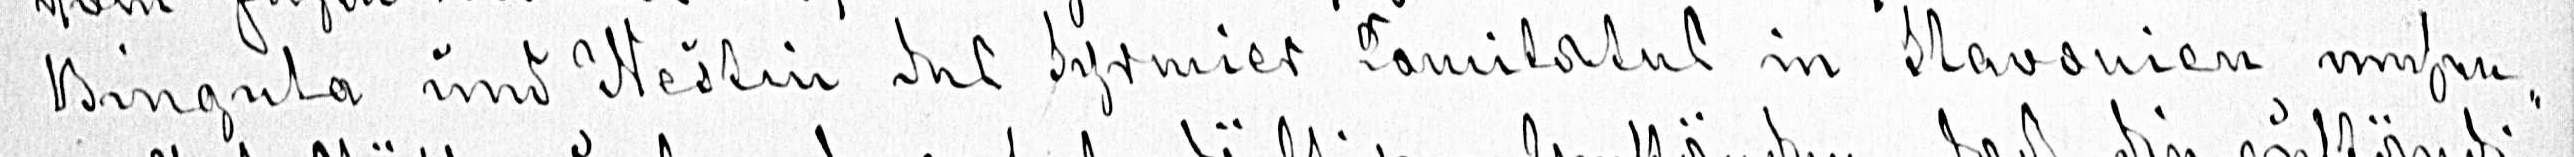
Bingula und Neštin des Syrmier Komitates in Slavonien mehre¬
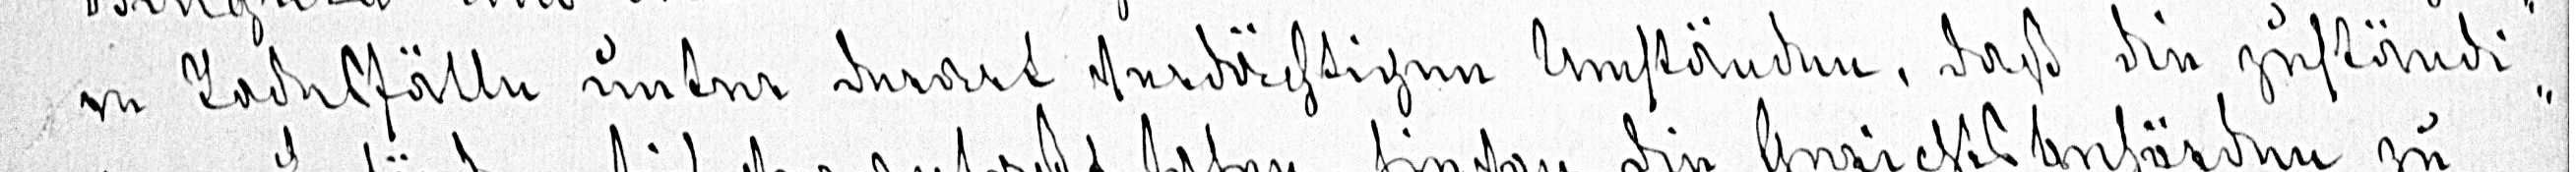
re Todesfälle unter derart verdächtigen Umständen, daß die zuständi¬
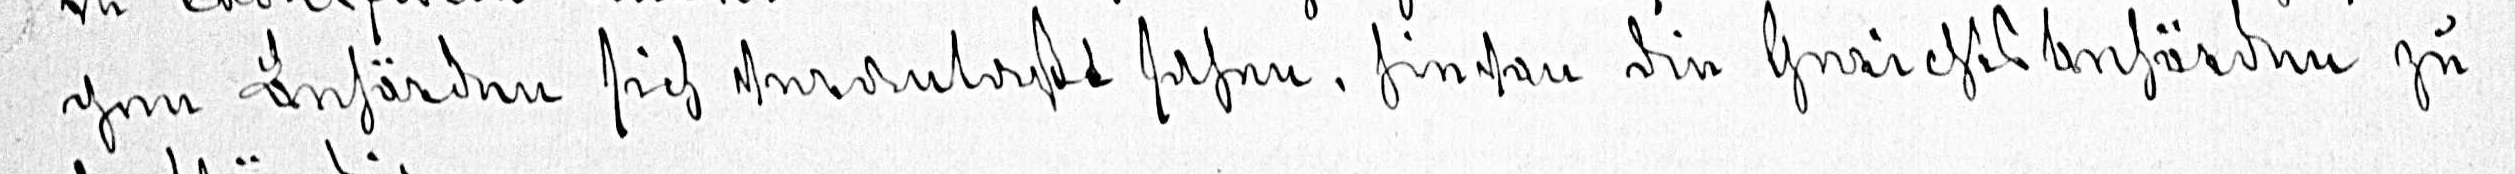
gen Behörden sich veranlaßt sahen, hievon die Gerichtsbehörden zu
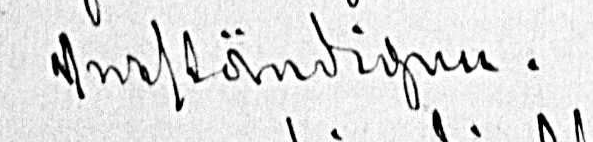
verständigen.
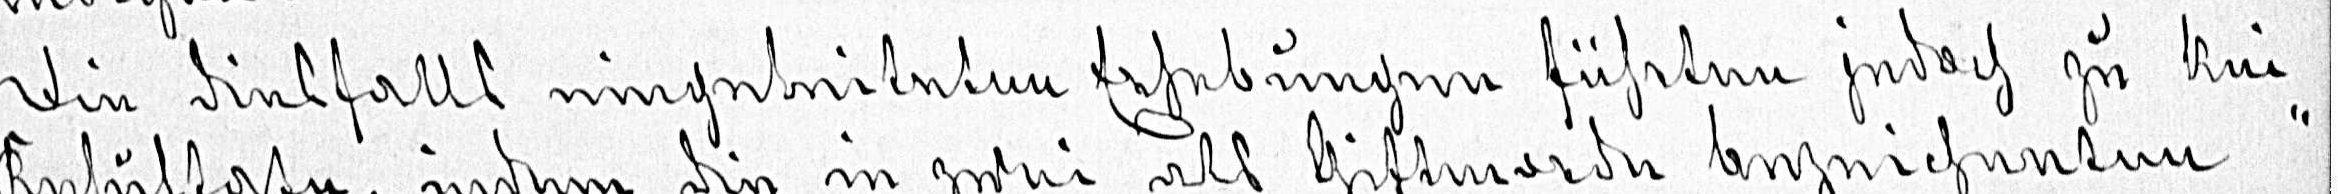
Die Diesfalls eingeleiteten Erhebungen führten jedoch zu kei¬
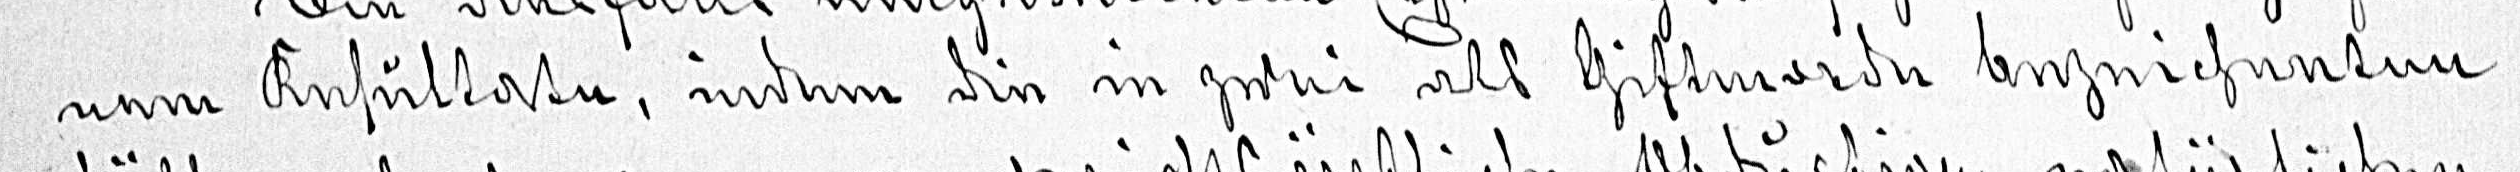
nem Resultate, indem die in zwei als Giftmorde bezeichneten
